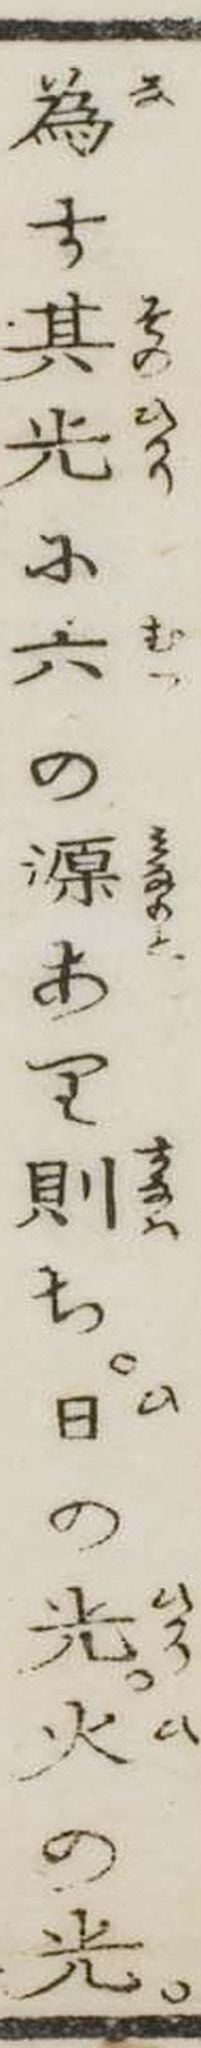為す其光に六の源あり則ち。日の光。火の光。
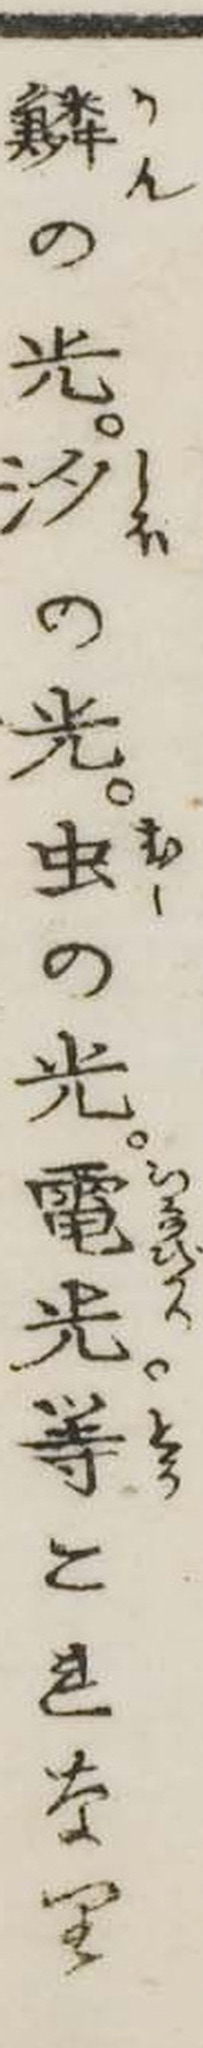鱗の光。汐の光。虫の光。電光。等これなり
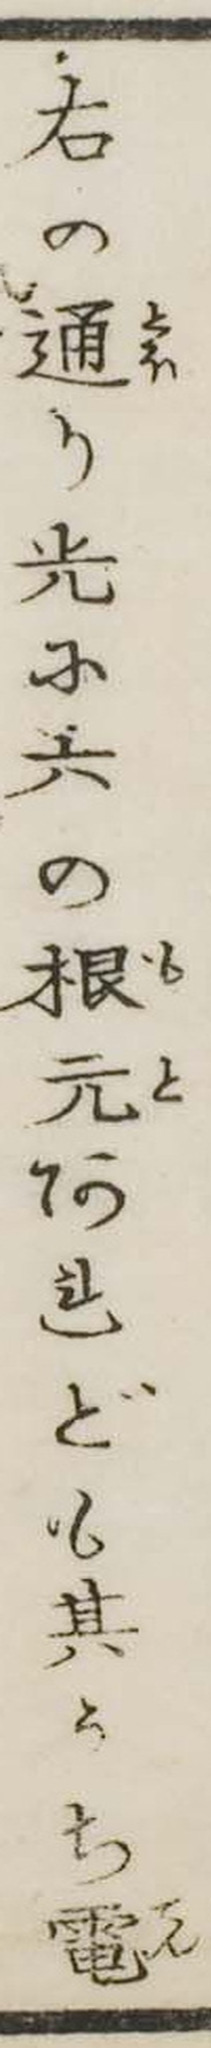右の通り光に六の根元あれども其うち電
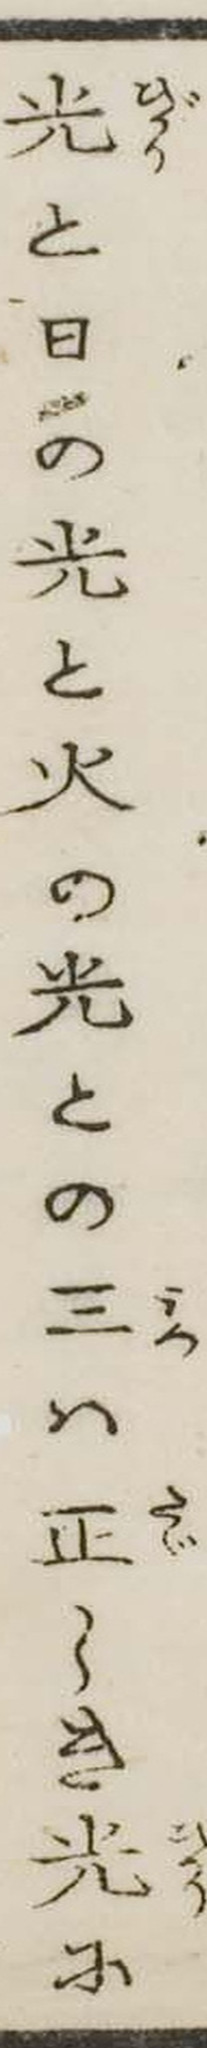光と日の光と火の光との三は正しき光に
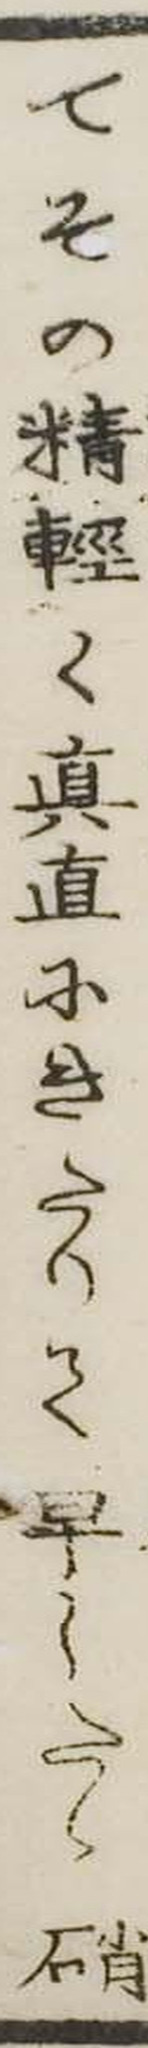てその精輕く真直にきたりて早したゝ硝
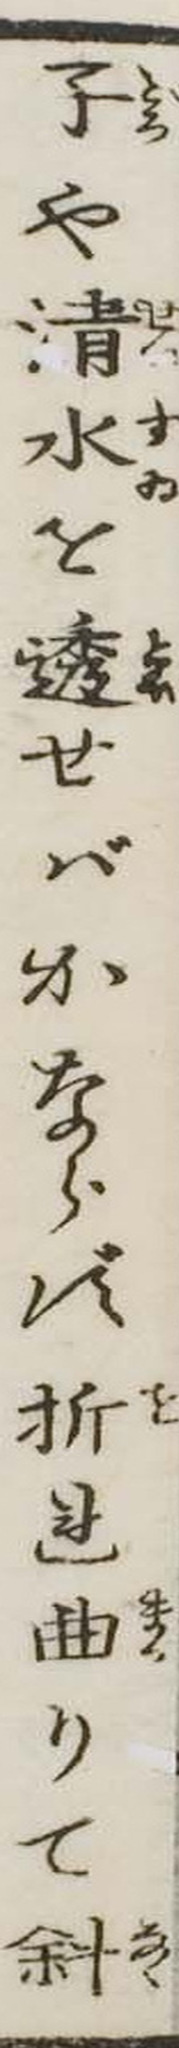子や清水を透せばかならず折れ曲りて斜
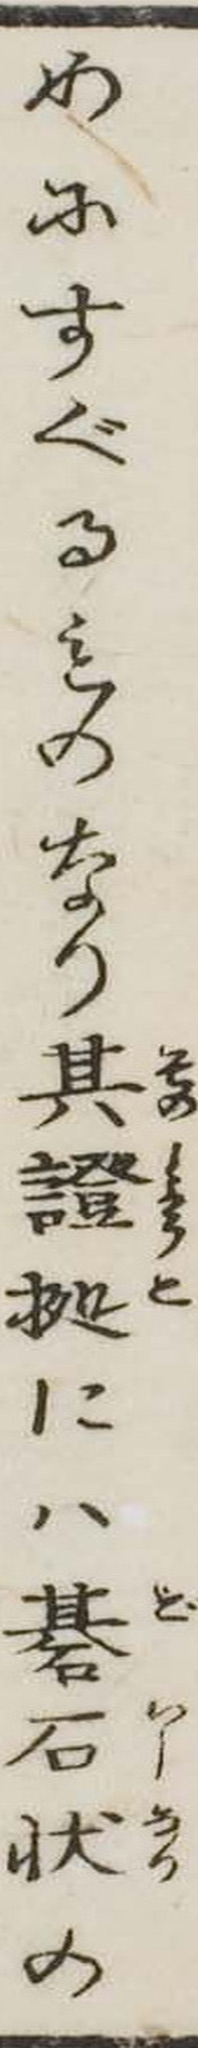めにすぐるものなり其證拠には碁石状の
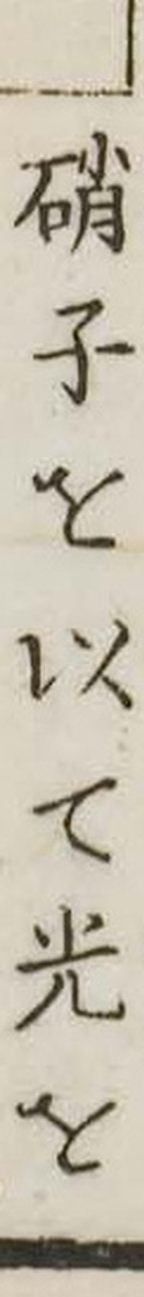硝子を以て光を
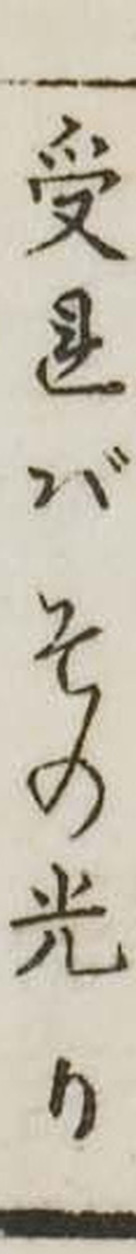受ればその光り
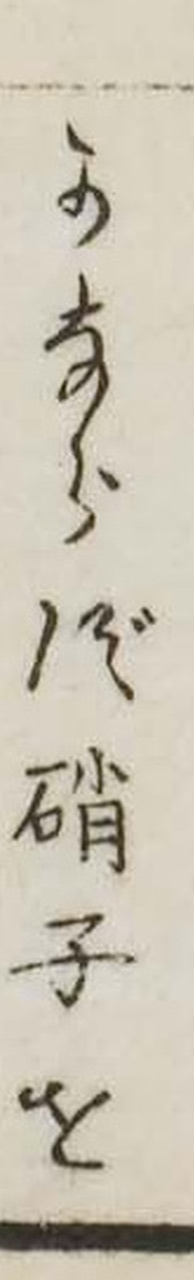かならず硝子を
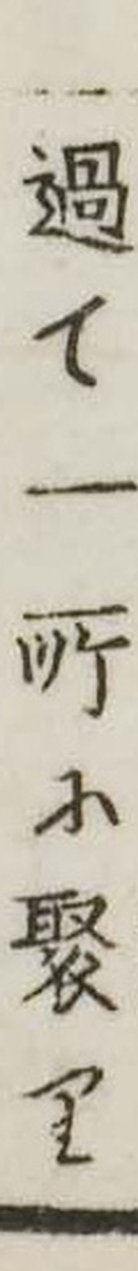過て一所に聚り
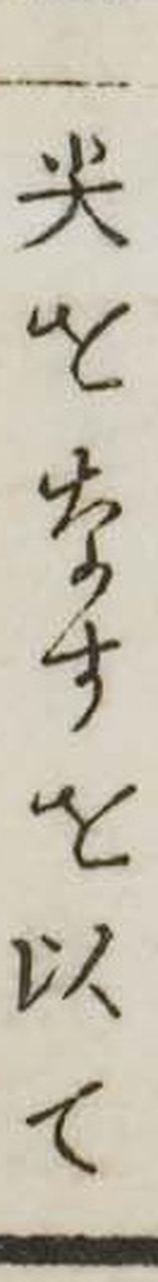尖をなすを以て
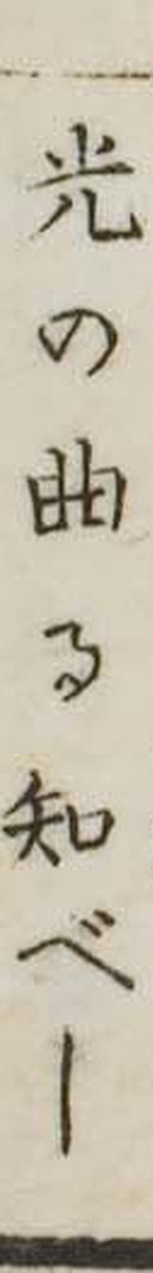光の曲る知べし

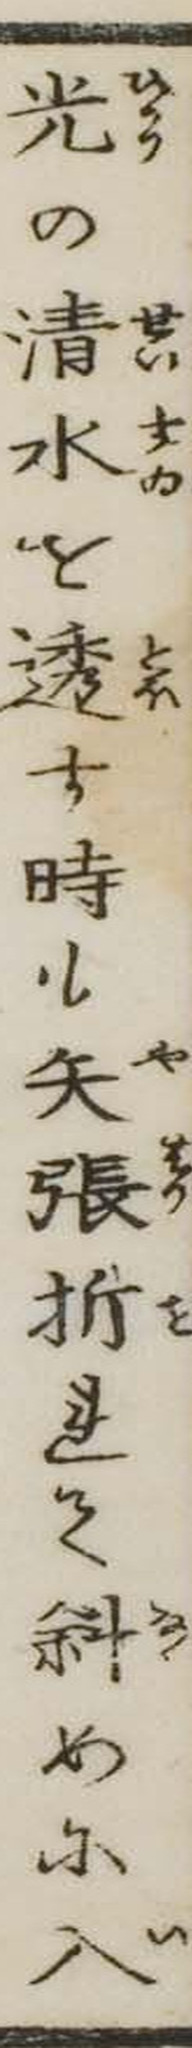光の清水を透す時も矢張折れて斜めに入
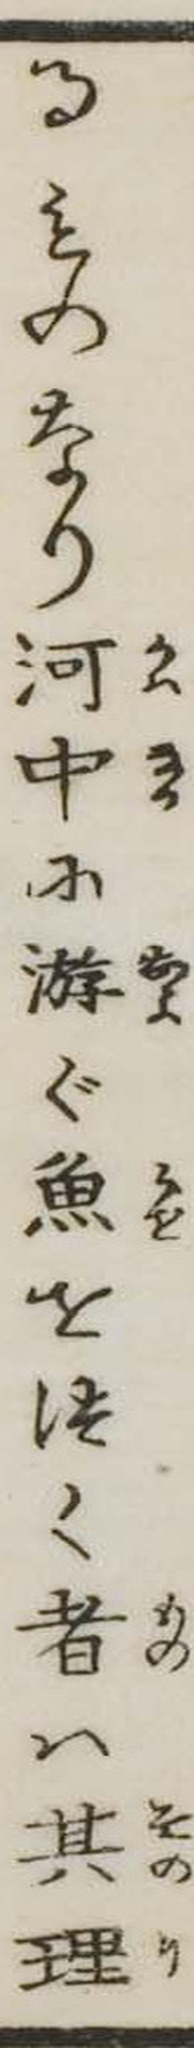るものなり河中に游ぐ魚をつく者は其理
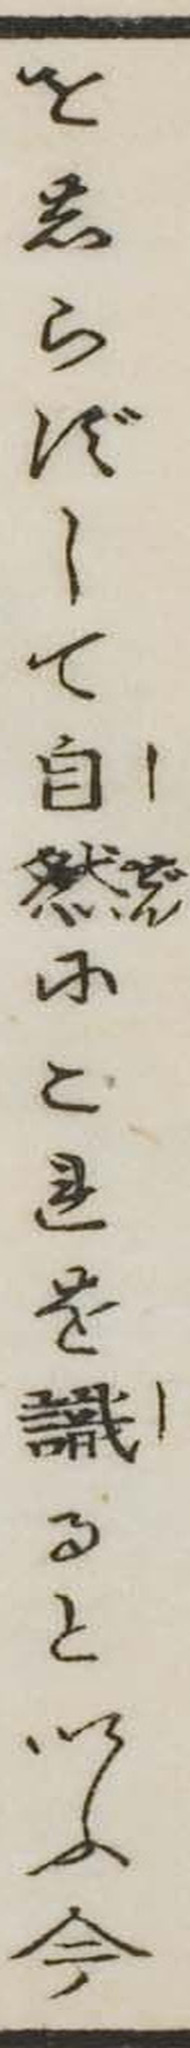をしらずして自然にこれを識るといふ今
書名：究理知慧の勧 : 訓蒙画入 巻之2
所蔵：東京学芸大学附属図書館
